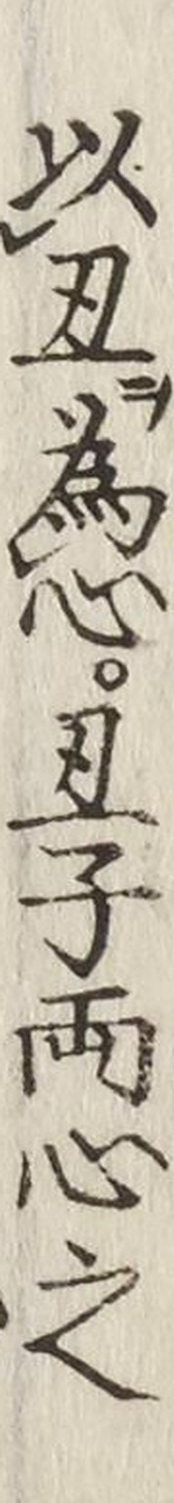以丒為心。丒子両心之
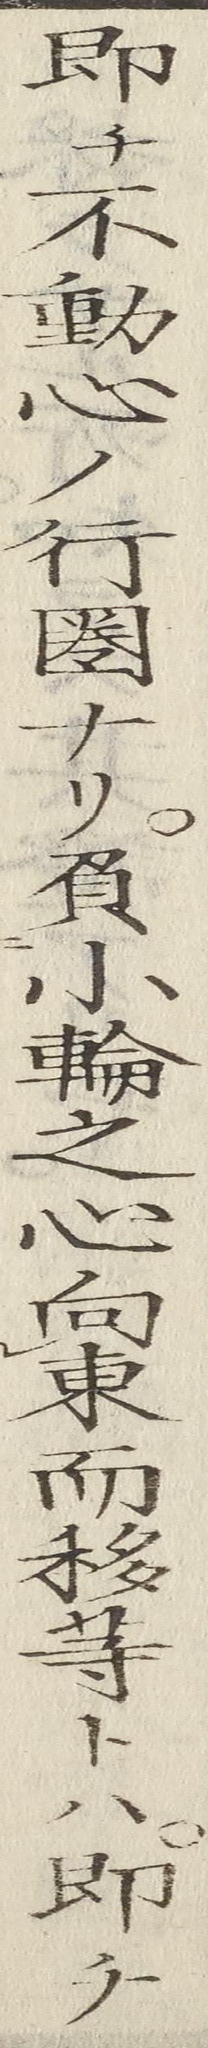即チ不動心ノ行圏ナリ。負ニ小輪之心向東而移等トハ。即チ
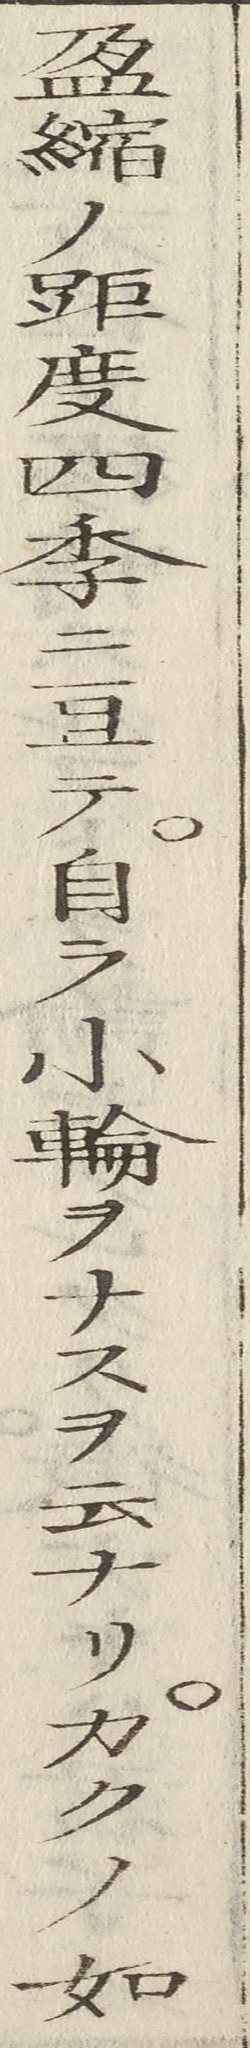盈縮ノ距度四季ニ且テ。自ラ小輪ヲナスヲ云ナリ。カクノ如
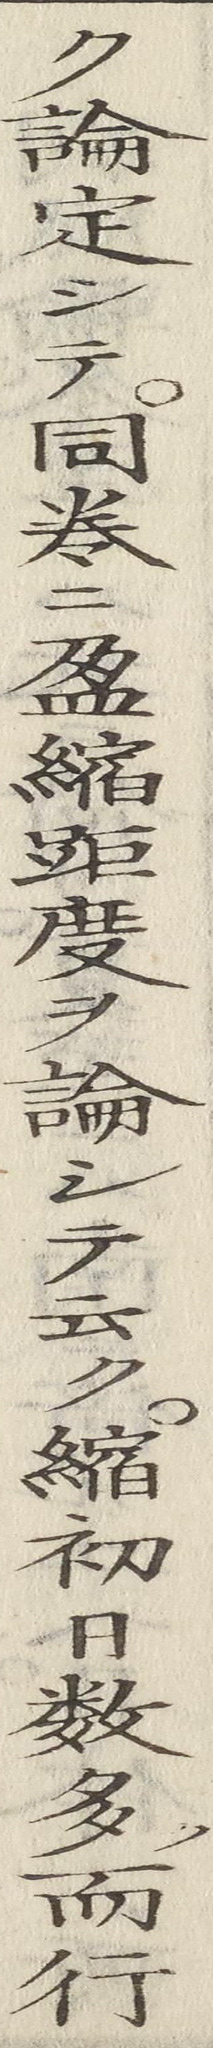ク論定シテ。同巻ニ盈縮距度ヲ論シテ云ク。縮初日数多而行
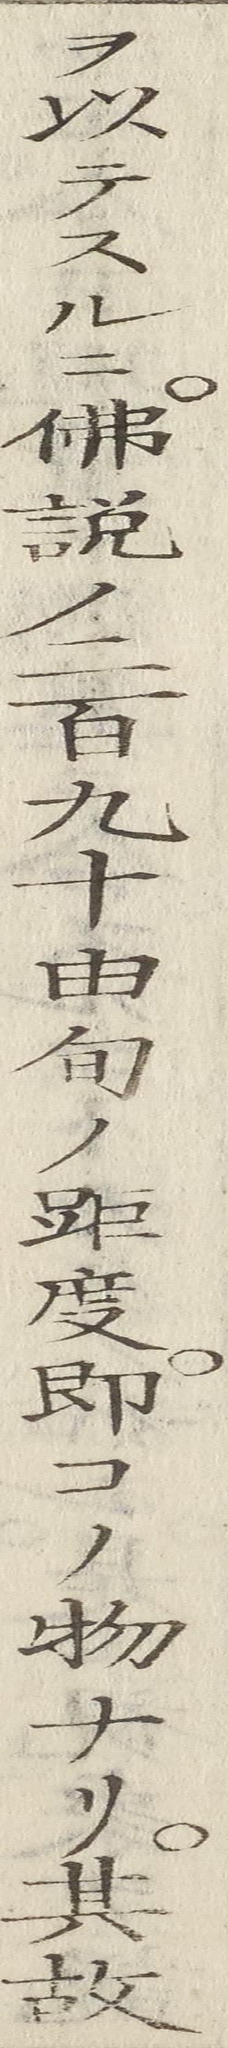ヲ以テスルニ。仏説ノ二百九十由旬ノ距度。即チコノ物ナリ。其故
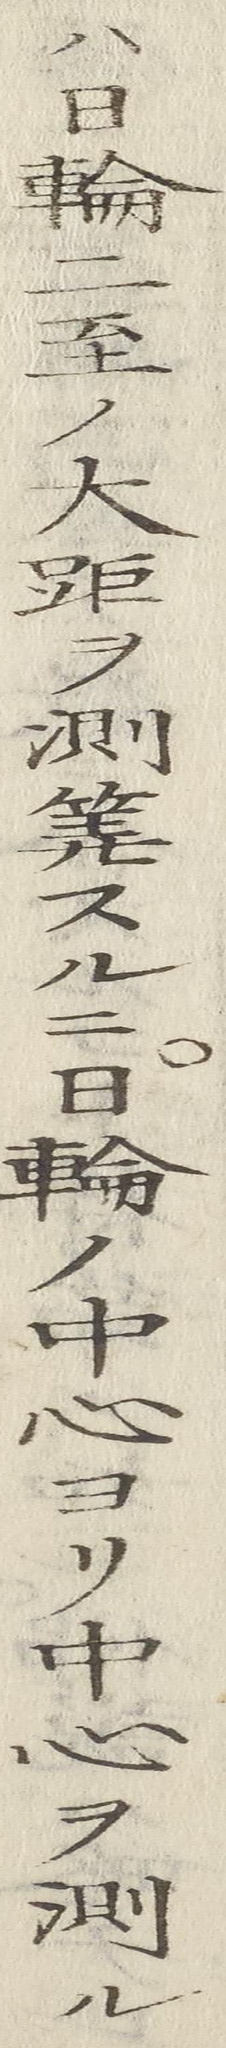ハ日輪ニ至ノ大距ヲ測筭スルニ。日輪ノ中心ヨリ中心ヲ測ル
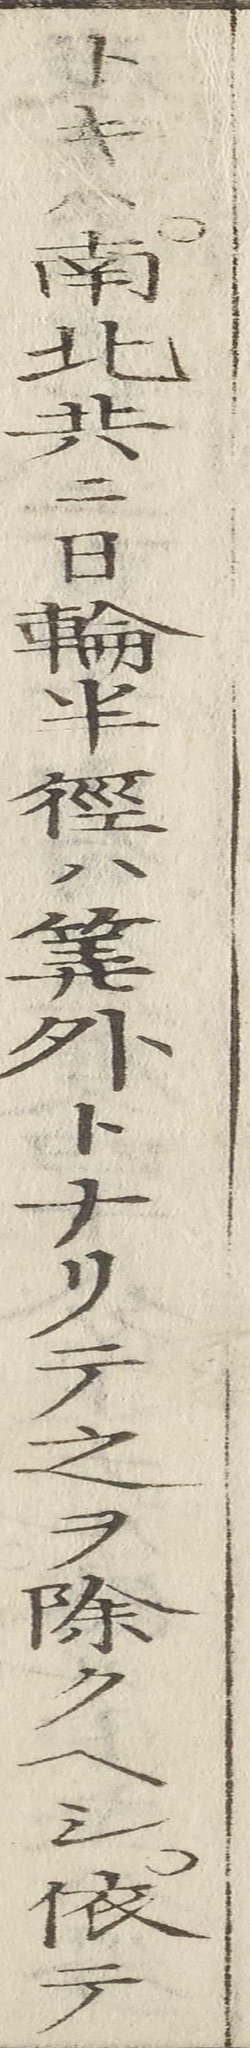トキハ。南北共ニ日輪半径ハ筭外トナリテ之ヲ除クヘシ。依テ
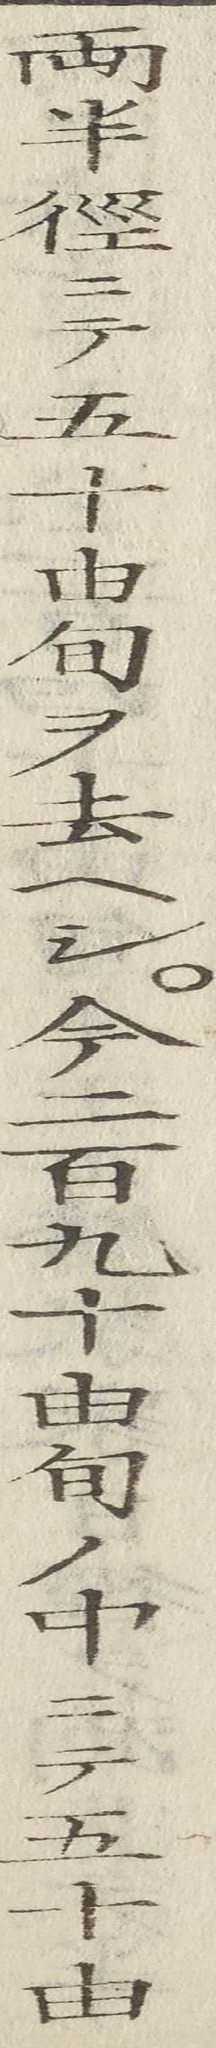両半径ニテ五十由旬ヲ去ヘシ。今二百九十由旬ノ中ニテ五十由

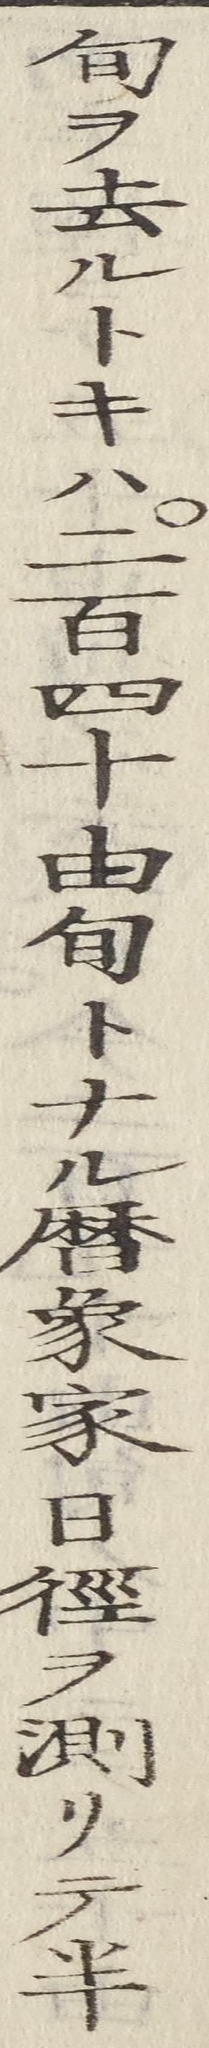旬ヲ去ルトキハ。二百四十由旬トナル暦象家日径ヲ測リテ半
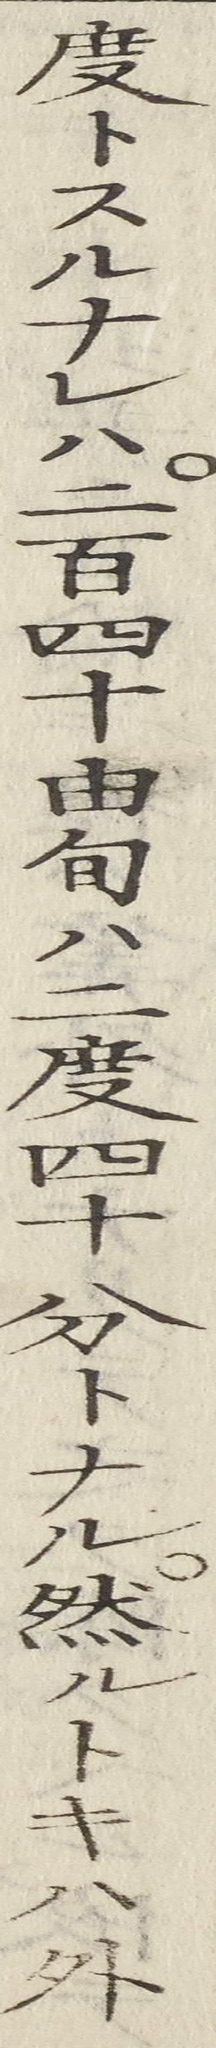度トスルナレハ。二百四十由旬ハニ度四十分トナル。然ルトキハ外
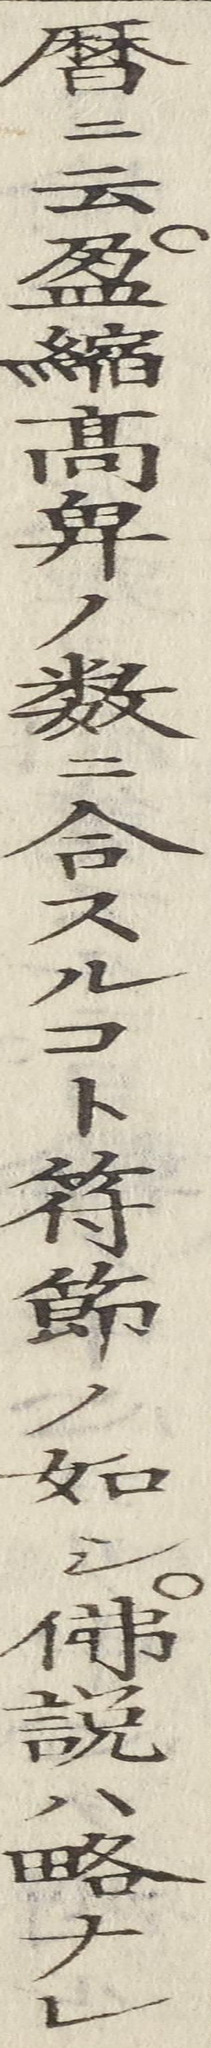暦ニ云。盈縮高卑ノ数ニ合スルコト符節ノ如シ。仏説ハ略ナレ
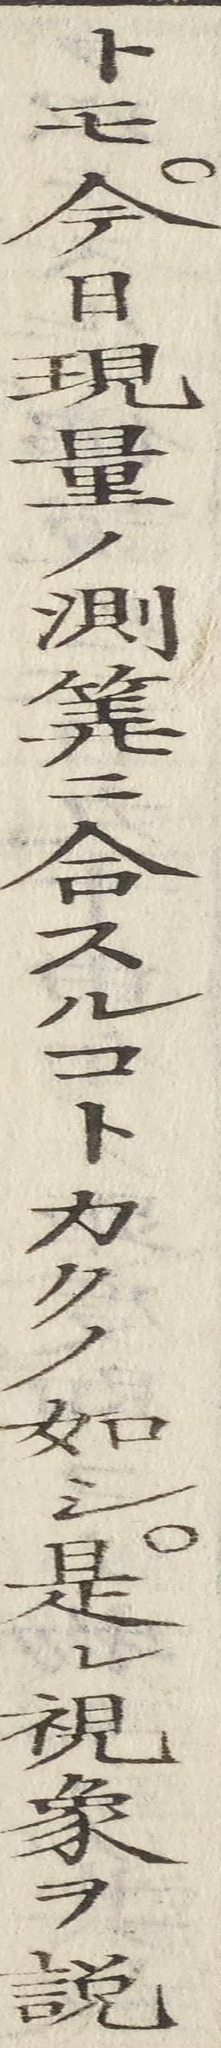トモ。今日現量ノ測筭ニ合スルコトカクノ如シ。是レ視象ヲ説
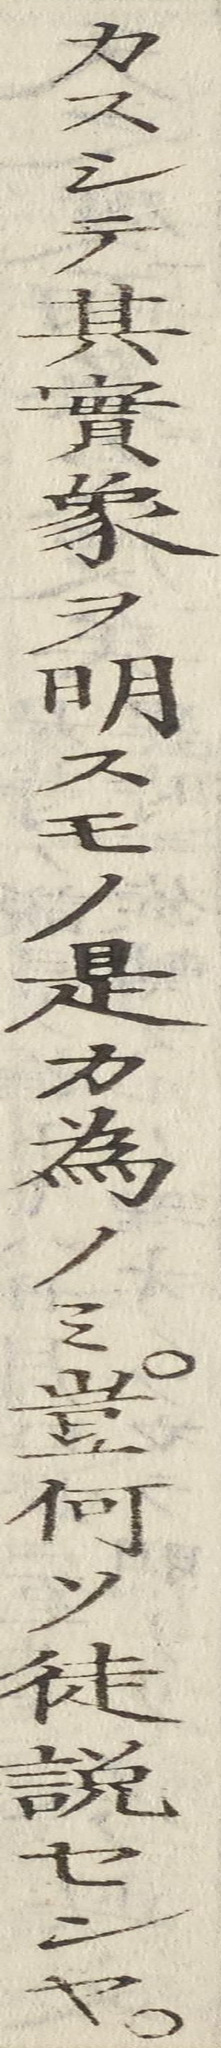カスシテ其実象ヲ明スモノ是カ為ノミ。豈何ソ徒説センヤ。
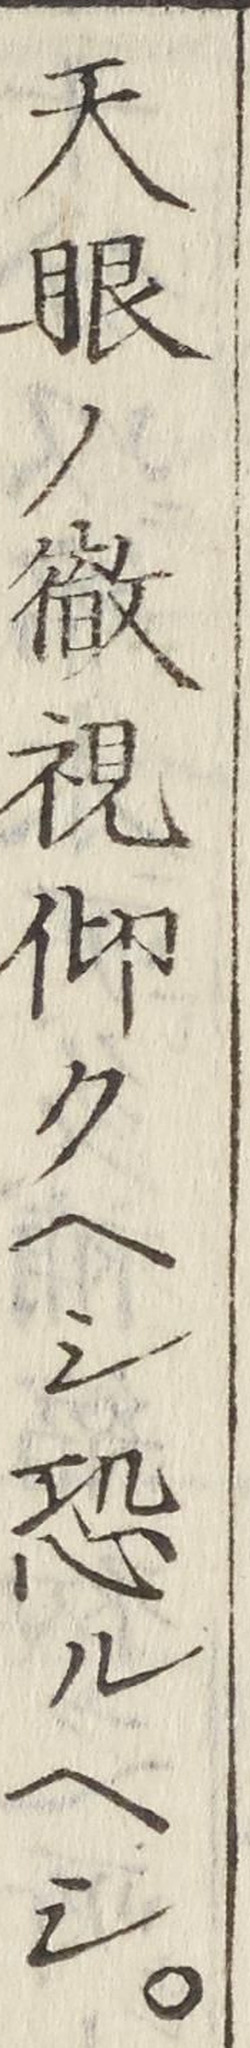天眼ノ徹視仰クヘシ恐ルヘシ。
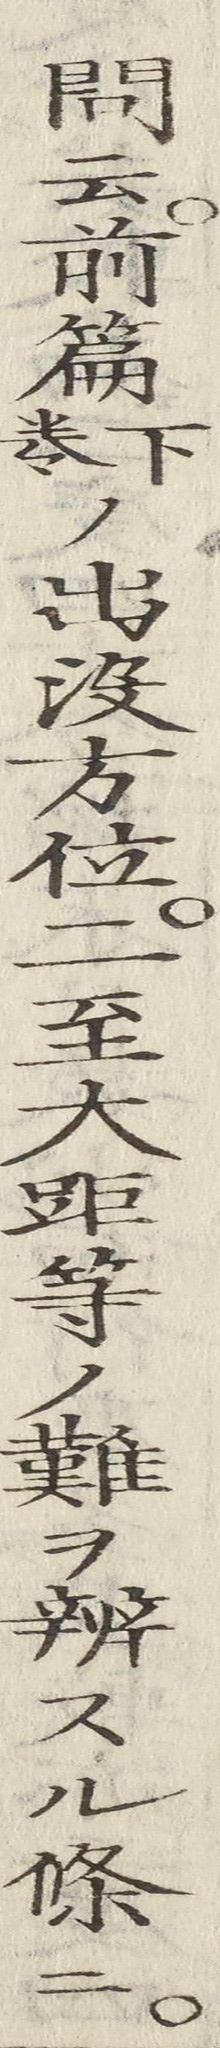問云。前編下巻ノ出没方位。ニ至大距等ノ難ヲ弁スル条ニ。
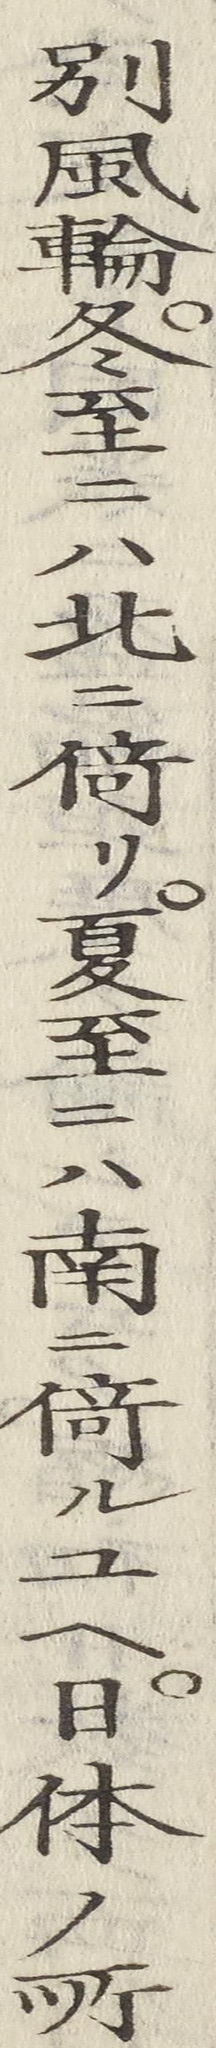別風輪。冬至ニハ北ニ倚リ。夏至ニハ南ニ倚ルユヘ。日体ノ所
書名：護法新論　二編　上
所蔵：東京大学地震研究所図書室 Earthquake Research Institute Library, The University of Tokyo, JAPAN
